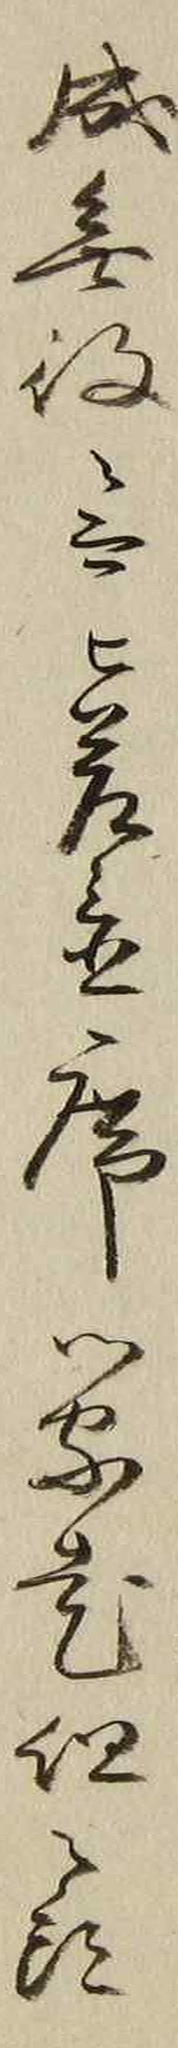成無役に而差置席御家老組之頭
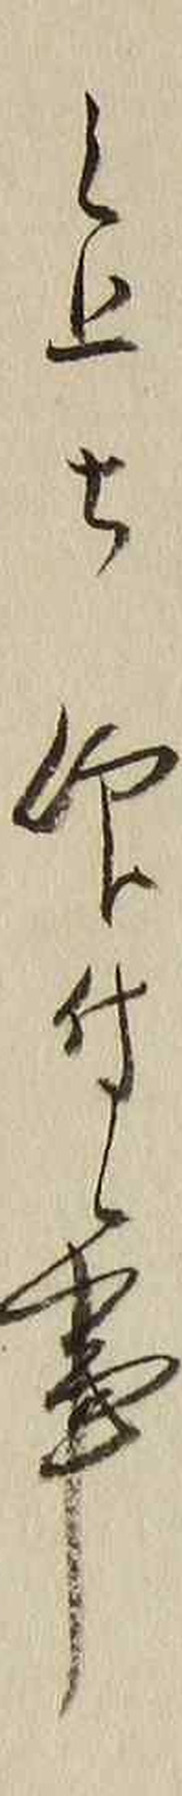之上被仰付候事
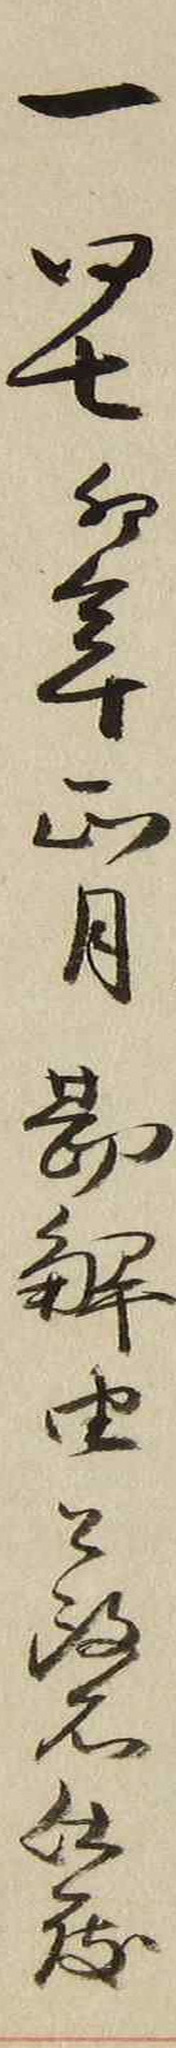一同七卯年正月勘解由と改名仕度
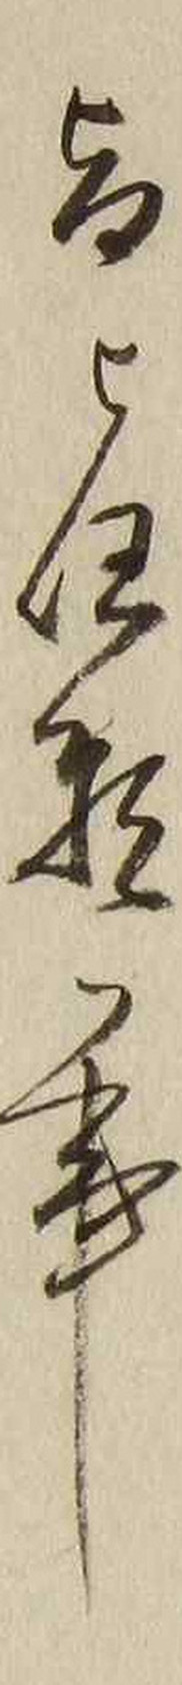旨被任願候事
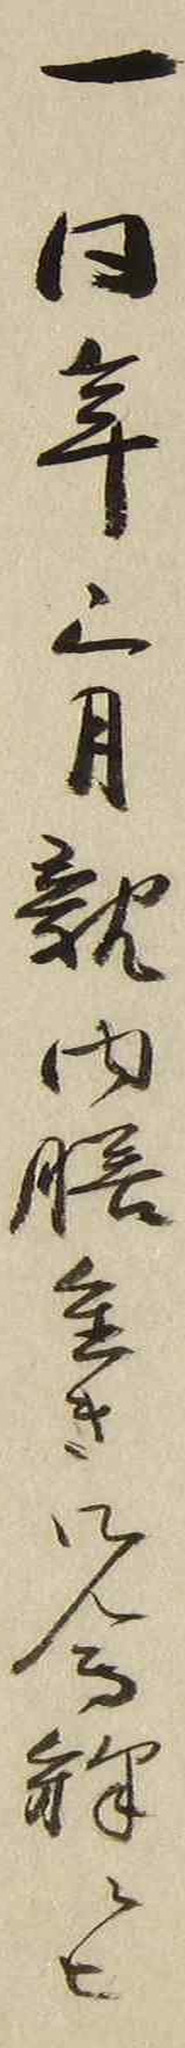一同年三月親内膳重き御会釈に被

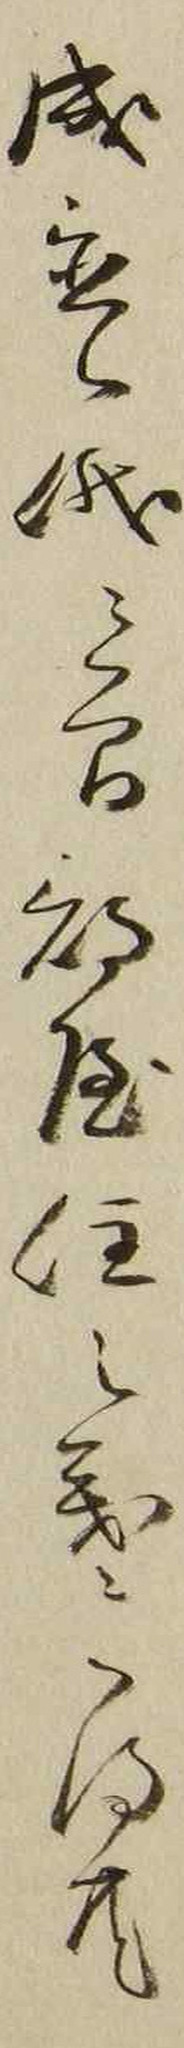成置候儀に候間部屋住之義に候得共
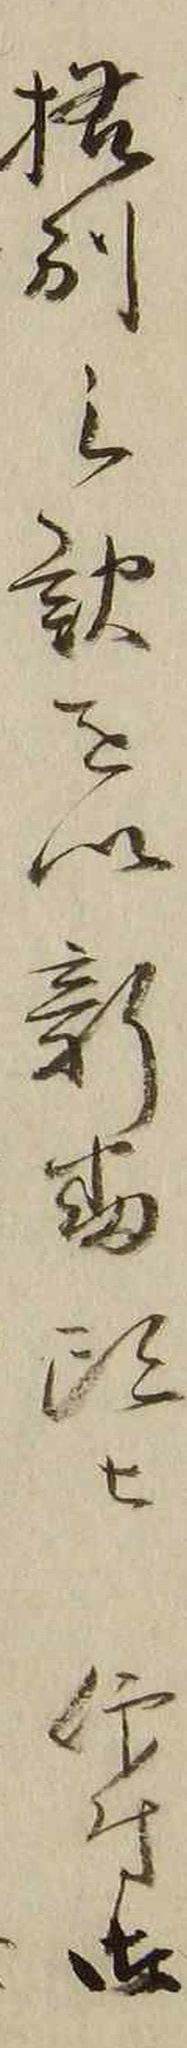格別の之訳を以新番頭被仰付御
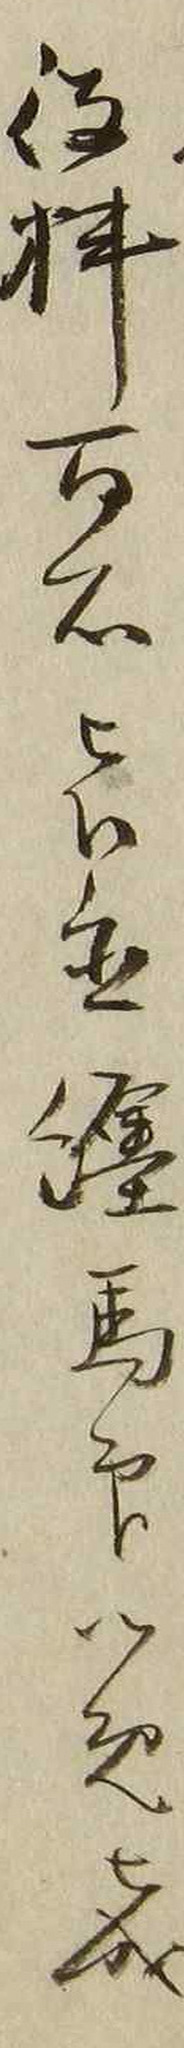役料百石被下置纒馬印御免被成
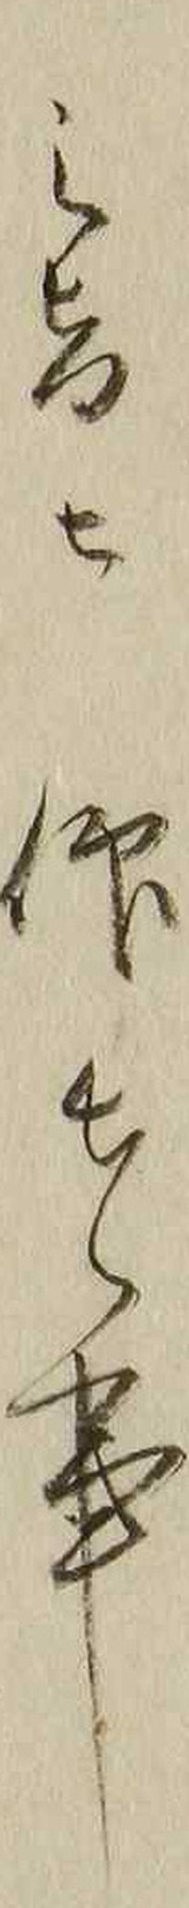之旨被仰出候事
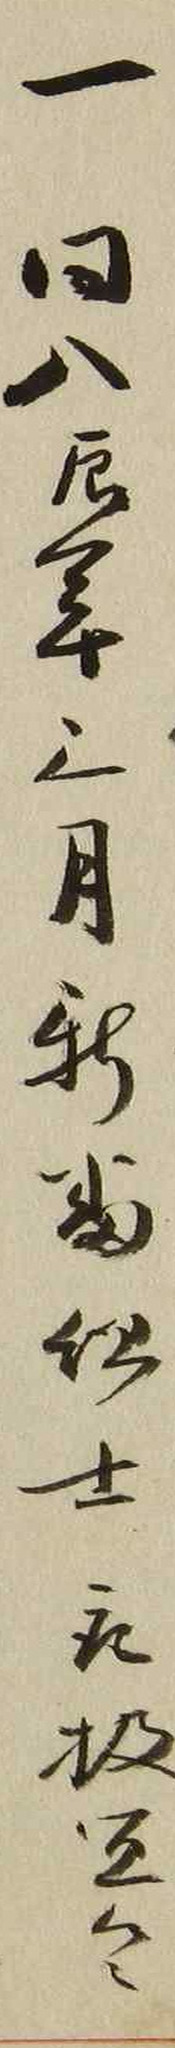一同八辰年三月新番組士取扱宜くに
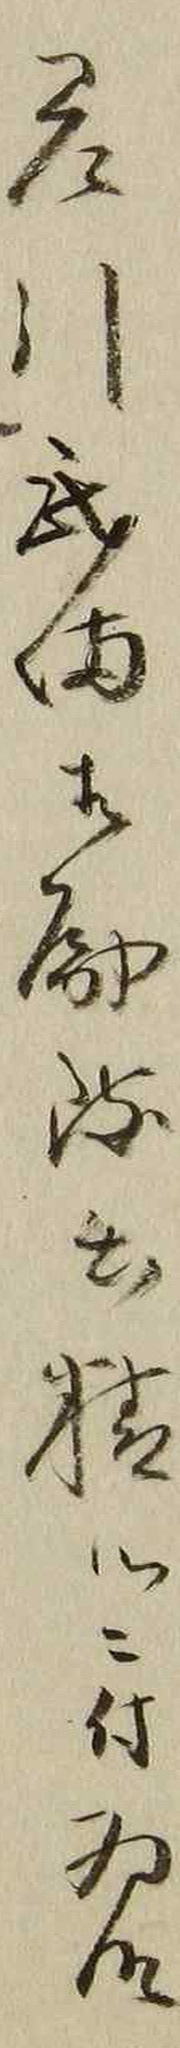差引武備相励致出精候に付為御
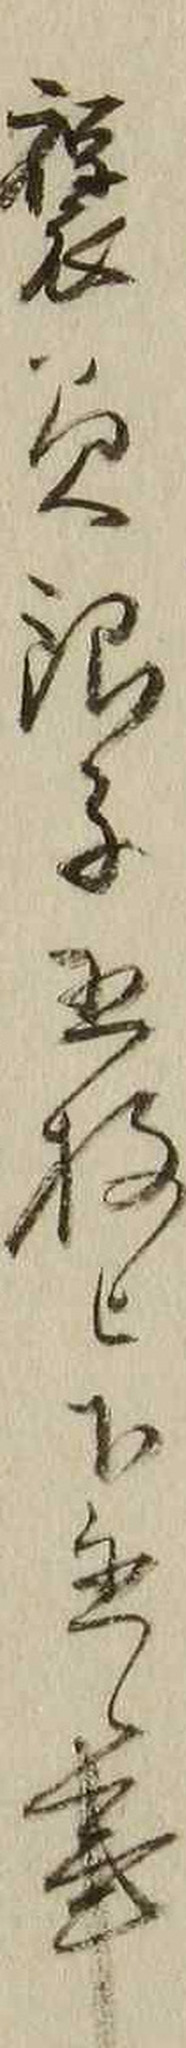褒美銀子五枚被下置候事
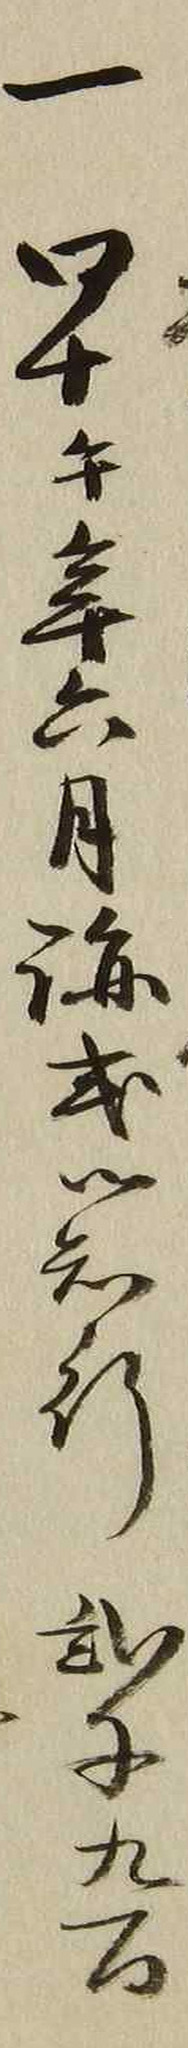一同十午年六月跡式御知行弐千九百
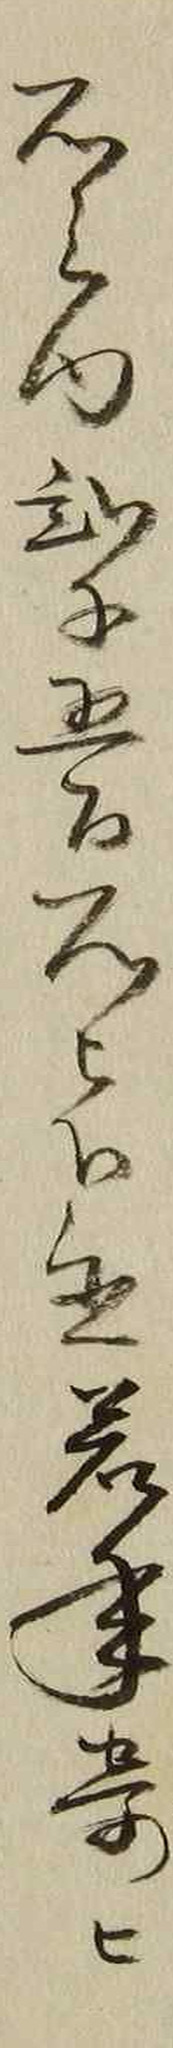石之内弐千五百石被下置若年寄被
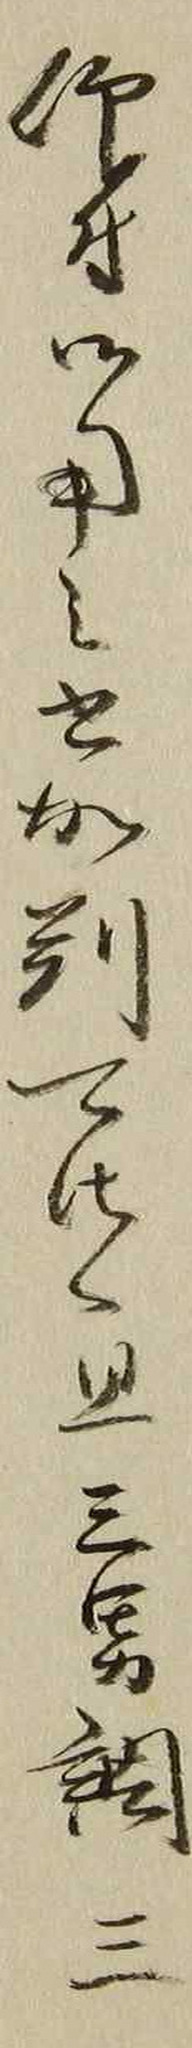仰付御用之書加判可仕候且三男調三
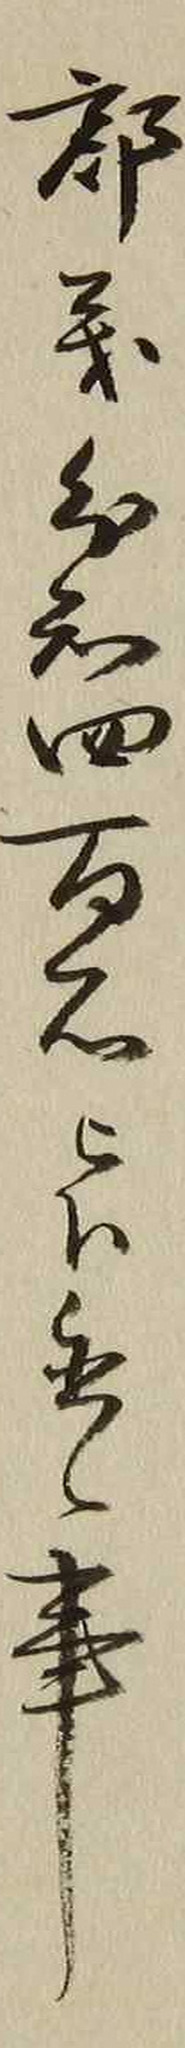郎義分知四百石被下置候事
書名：諸士系譜　巻之292　き之部1
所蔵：会津若松市立会津図書館
